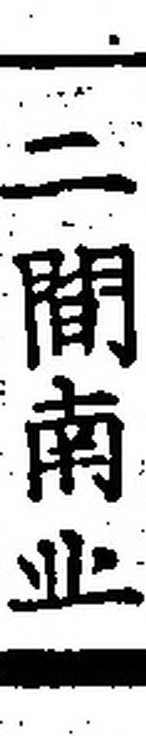二間南北
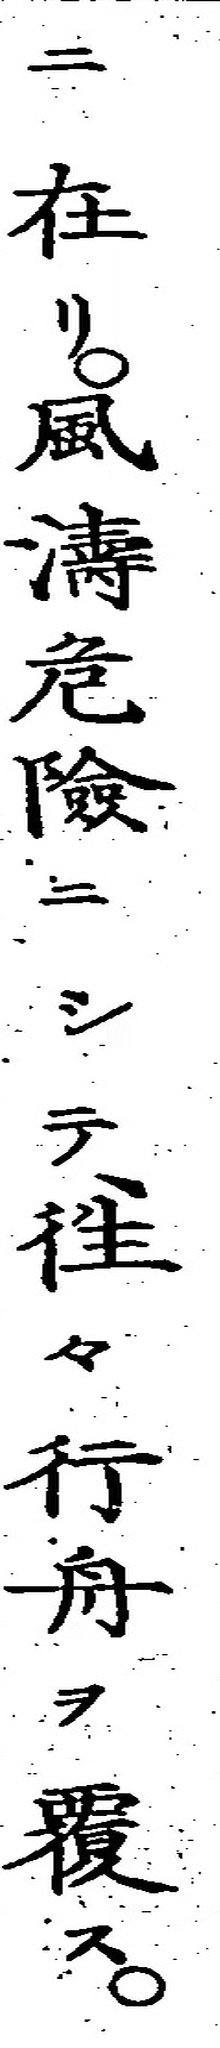ニ在リ。風濤危険ニシテ、往々行舟ヲ覆ス。
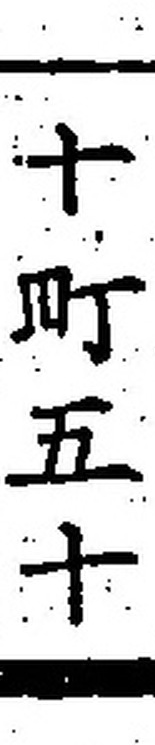十町五十
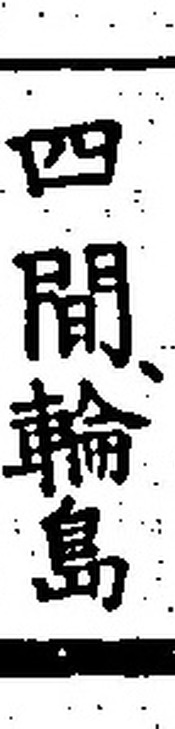四間、輪島
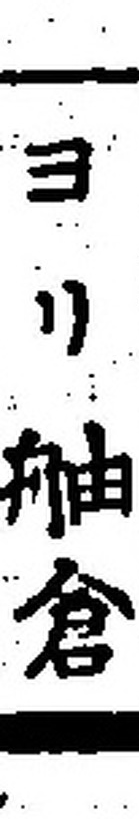ヨリ舳倉
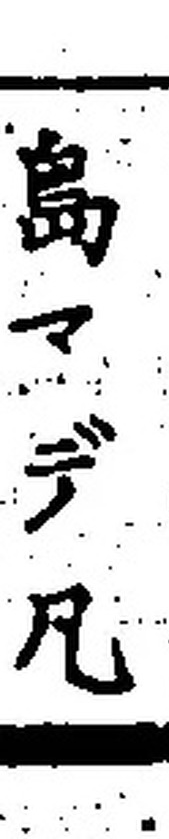島マデ凡
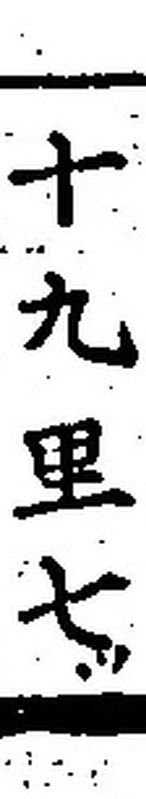十九里七
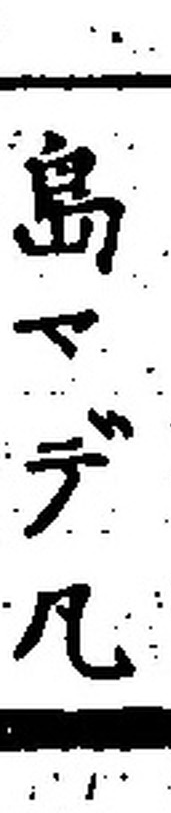島マデ凡
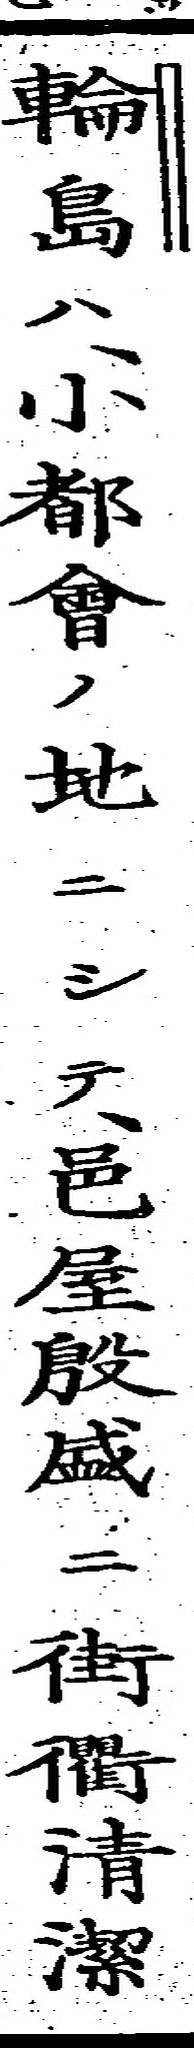輪島ハ、小都会ノ地ニシテ、邑屋殷盛ニ街衢清潔
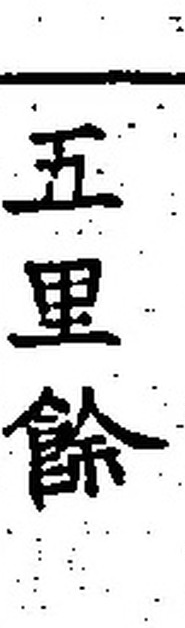五里余
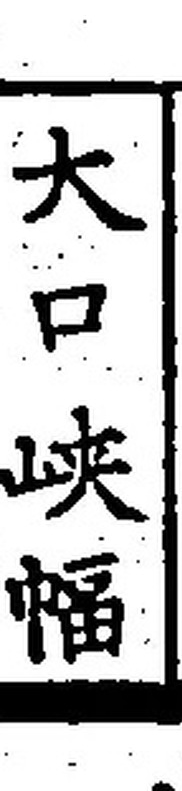大口峡幅
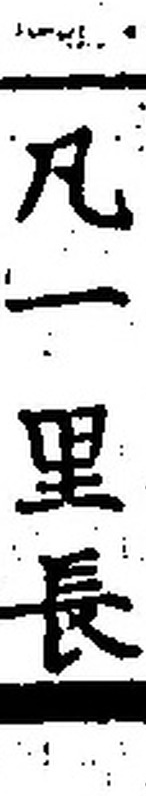凡一里長
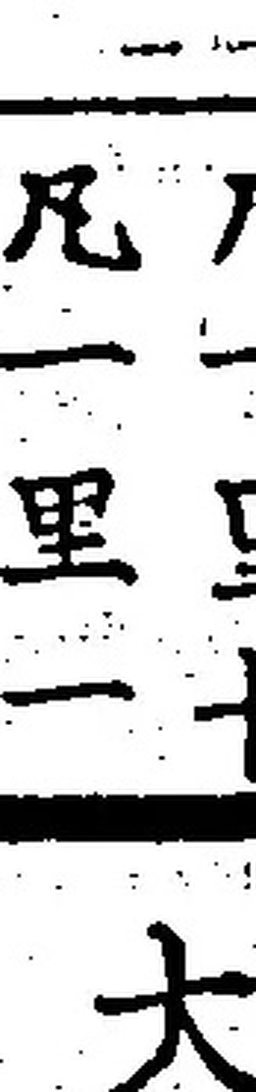凡一里一
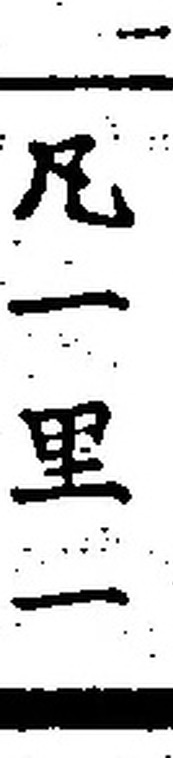凡一里一
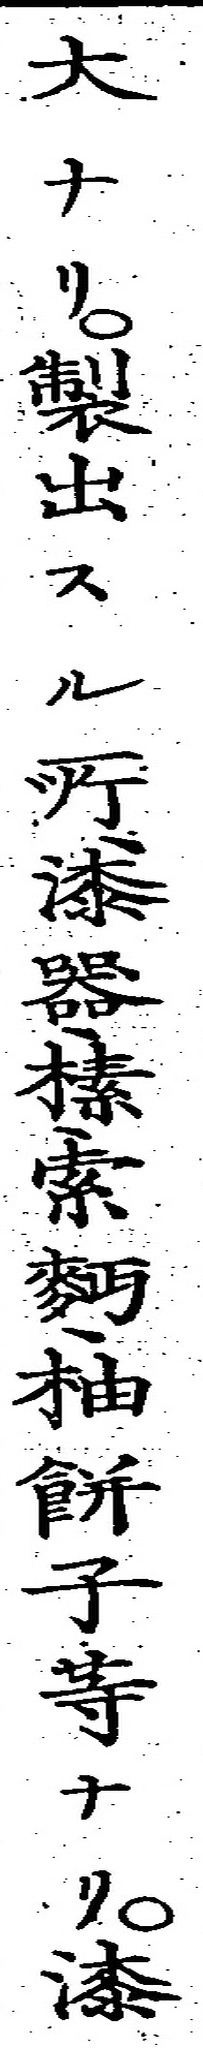大ナリ。製出スル所、漆器・榡・索麺・柚餅子等ナリ。漆
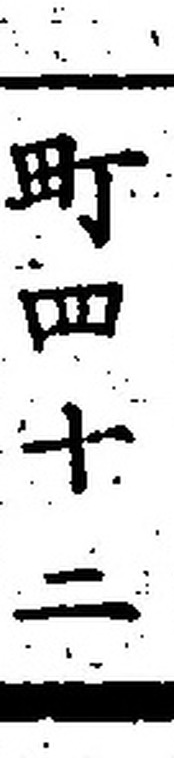町四十二
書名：能登地誌略
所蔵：国立国会図書館 National Diet Library, JAPAN
